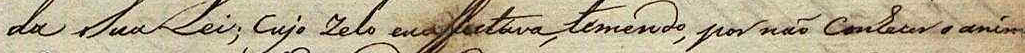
da sua Lei; cujo zelo eu affectava, temendo, por por naõ conhecer o animo
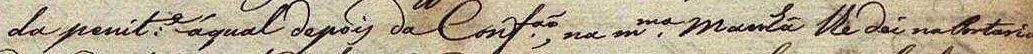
da penit.e á qual depois da Conf.aõ, na m.ma manhã lhe dei na portaria
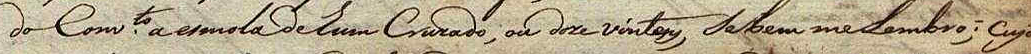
do Conv.to a esmola de hum cruzado, ou doze vintens, se bem me lembro; cuja
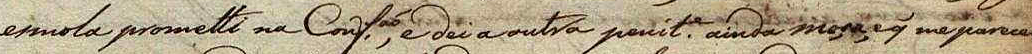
esmola prometti na Conf.aõ, e dei a outra penit.e ainda mōça, e q̄ me pareceo
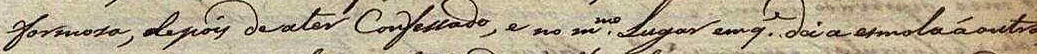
formoza, depois de a ter confessado, e no m.mo lugar em q̄ dei a esmola á outra,
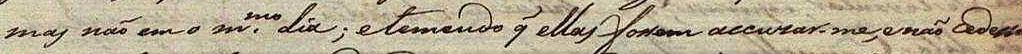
mas naõ em o m.mo dia; e temendo q̄ ellas fossem accuzar-me, e naõ cedessem
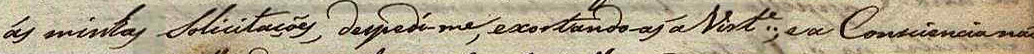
ás minhas solicitações, despedi-me, exortando-as á Virt. ; e a Consciencia naõ
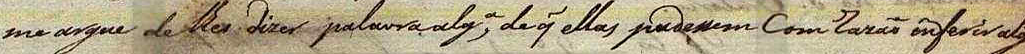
me argue de lhes dizer palavra alg.a, de q̄ ellas pudessem com razaõ enferir alg.m
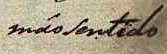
máo sentido.
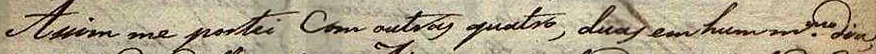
Assim me portei com outras quatro, duas em hum m.mo dia,
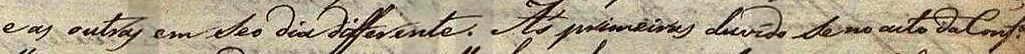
e as outras em seo dia differente. As primeiras duvido se no acto da Conf.aõ
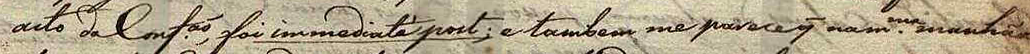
acto da Conf.aõ, foi immediate post; e tambem me parece q̄ na m.ma manhãa
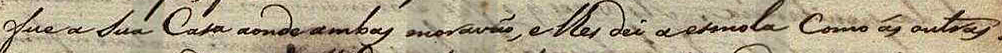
fue a sua Casa onde ambas moravaõ, e lhes dei a esmola como ás outras:
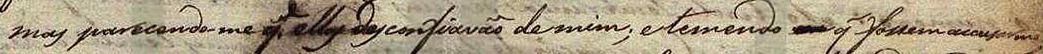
mas parecendo-me q̄ ellas desconfiavaõ de mim; e temendo _ q̄ fossem acusar-me,
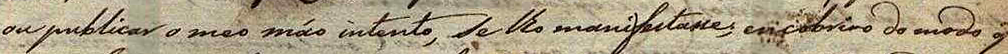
ou publicar o meo máo intento, se lho manifestasse, encobrio do modo q̄
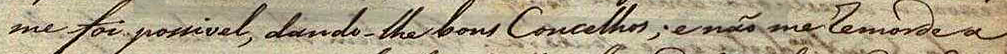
me foi possivel, dando-lhe bons Concelhos; e naõ me remorde a
